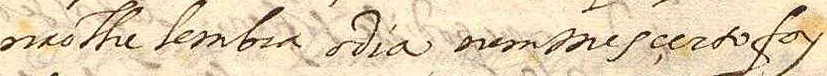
naõ lhe Lembra o dia nem mes çerto foy
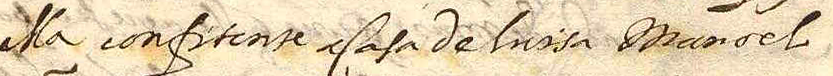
ella confitente a Casa de luisa Manoel
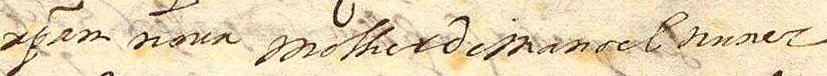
xpãm noua molher de manoel nunez
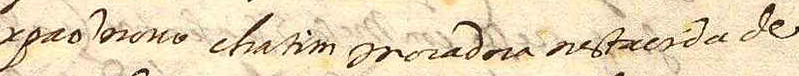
xpaõ nouo chatim moradora nesta cidade
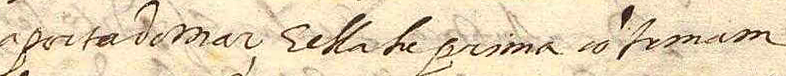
a porta do mar, E ella he prima cō Irmam
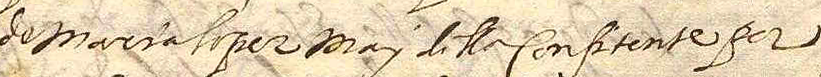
de Marta lopez May della Confitente por
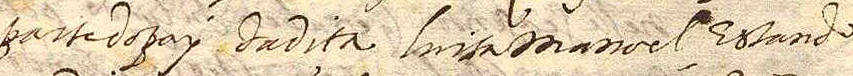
parte do pay da dita luisa Manoel, Estando
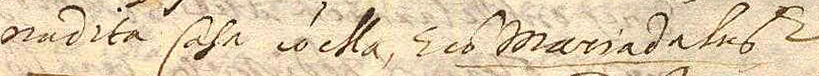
na dita Casa cō ella, E cō Maria da lus E
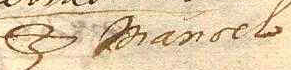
ManoeL
